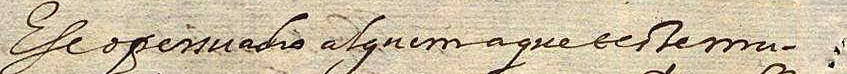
E se o persuadio alguem a que testemu
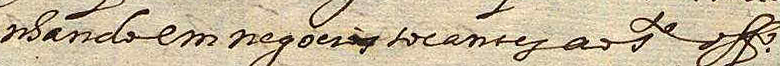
nhando em negocio tocantes ao Sto off.o
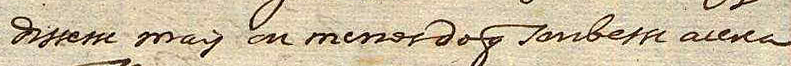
dissesse mais ou menos do q̄ soubesse acerca
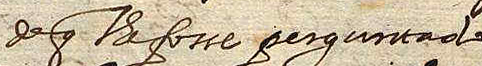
do q̄ lhe fosse perguntado
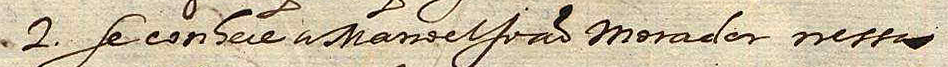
se conhece a Manoel Joaõ morador nessa
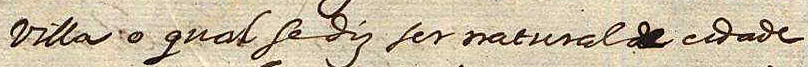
Villa o qual se diz ser natural da cidade
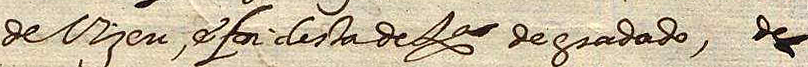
de Uizeu, e foi desta de Lxa degradado, de
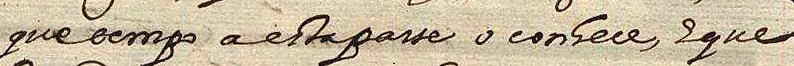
que tempo a esta parte o conhece, E que
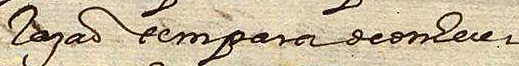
rezaõ tem para o conhecer
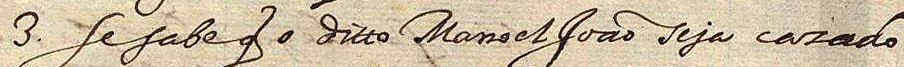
Se sabe q̄ o ditto Manoel Joaõ seja cazado
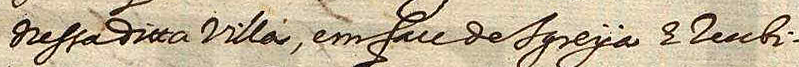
nessa ditta villa, em face de Jgreija E recebi
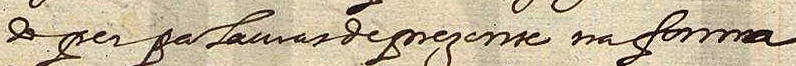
do per palavras de prezente na forma
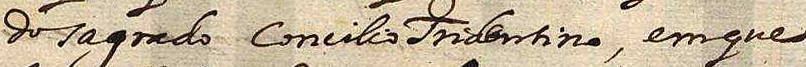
do sagrado concilio Tridentino, em que
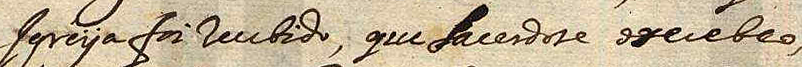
Jgreija foi recebido, que Sacerdote o recebeo,
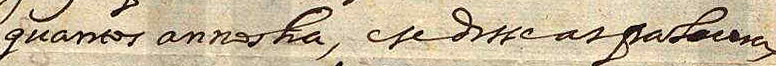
quanto annos ha, e se disse as palauras
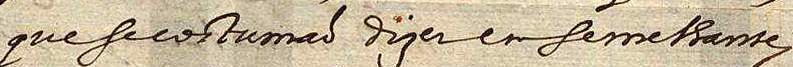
que se costumaõ dizer em semelhantes
